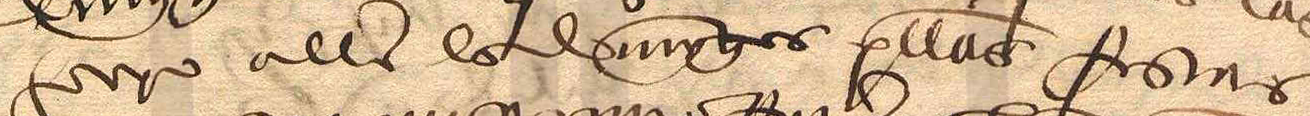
ho vyo allē de domȳgos p̄llas festas
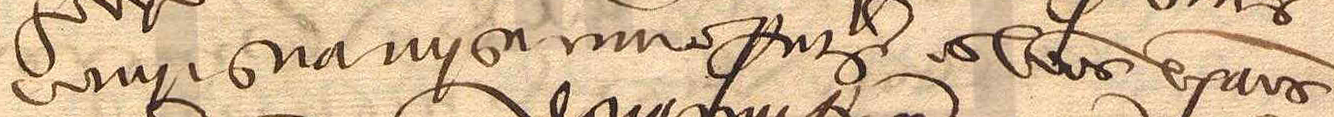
ouujr sua mjsa como fazē os bōos x̄pãos
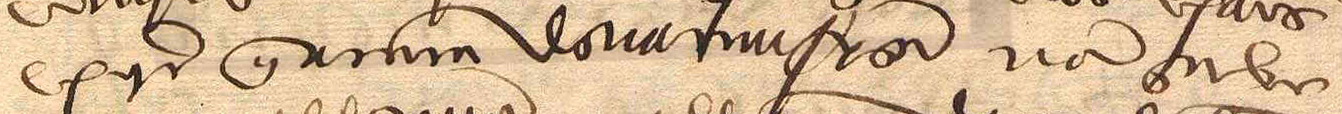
e porē q̄ acerca de sua comfysā nā sabe
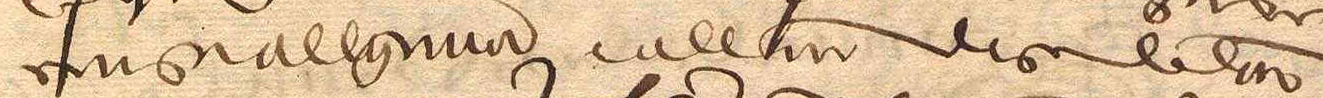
cousa allguūa e all n̄o dise do dito
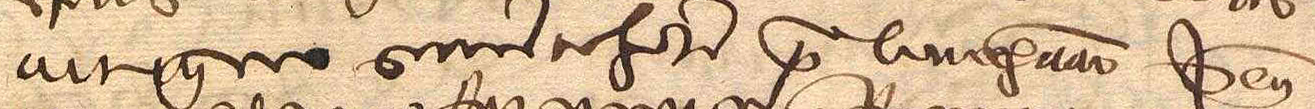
artiguo somēte ho tē p̄o bom xpaão e q̄
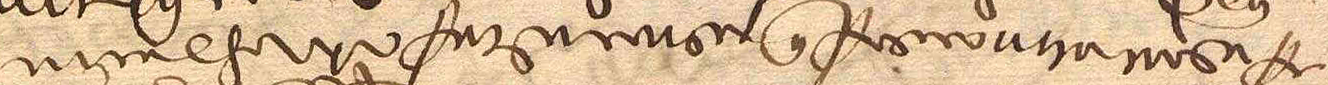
nuca lhe vyo fazer cousa q̄ fose contra nosa fe
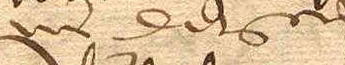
nē dizer
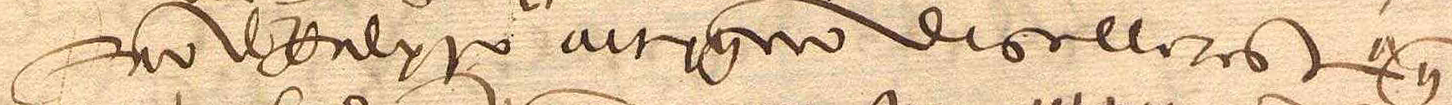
item ao deRadeyro artyguo dise lle testa q̄
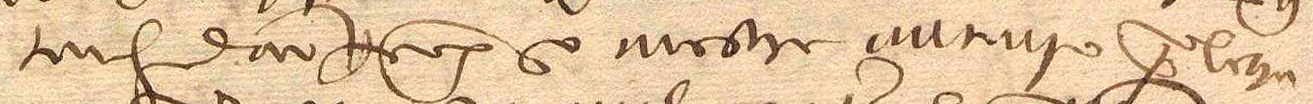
tē ho dito Reo p̄so mestre antonjo p̄o letra
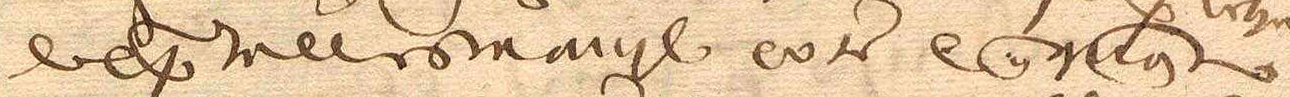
do e p̄o tall esta aujdo e o tē e q̄ quāto
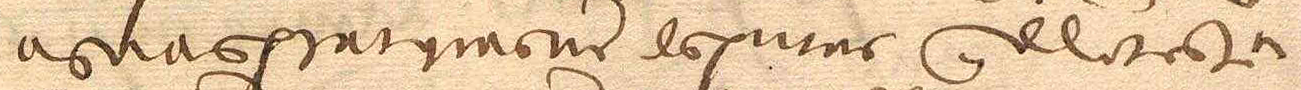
a suas pratycas nē desputas q̄ elle testa
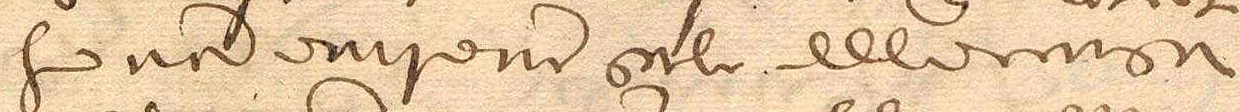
ho nā ouujo nē sabe dello cousa
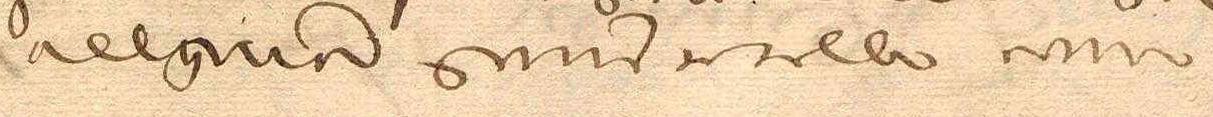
allguā somēte tello como
